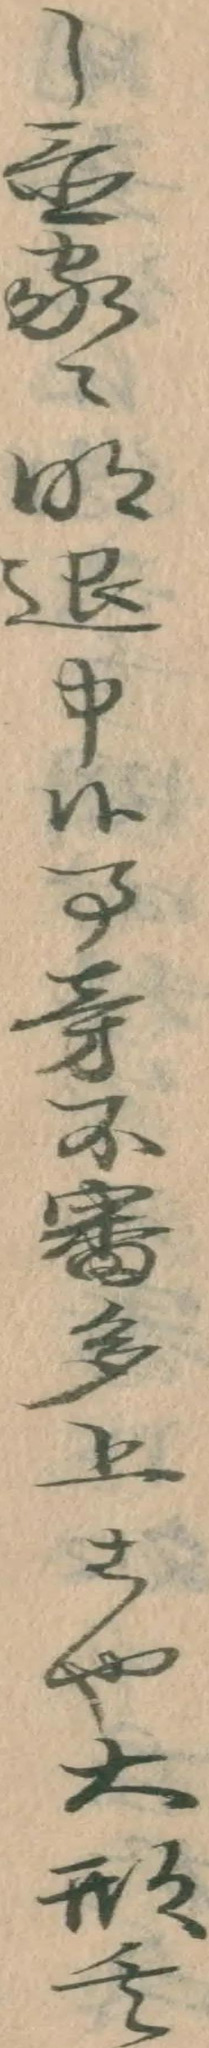し置家々明退申候事旁不審多上はや大形其
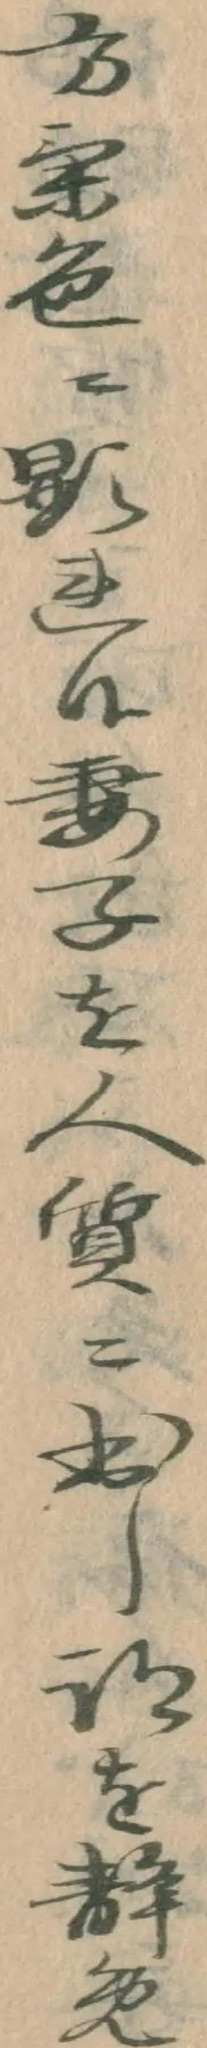方気色に顕れ候妻子を人質に出し跡を静め
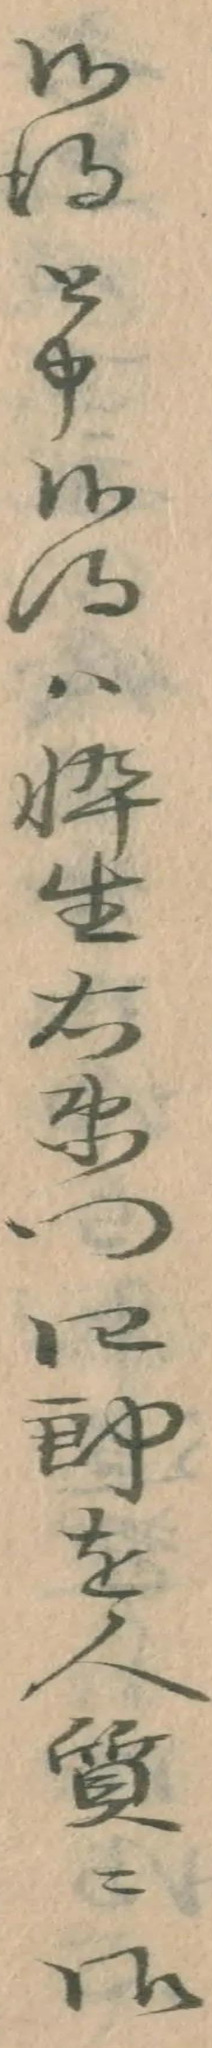候得と申候得は倅生右衛門四郎を人質に御
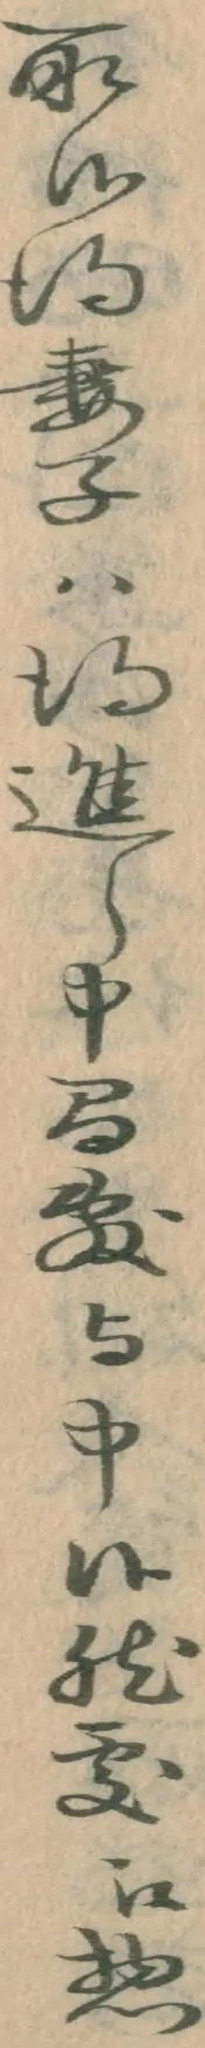取候得妻子は得進し申間敷与申候然処え惣

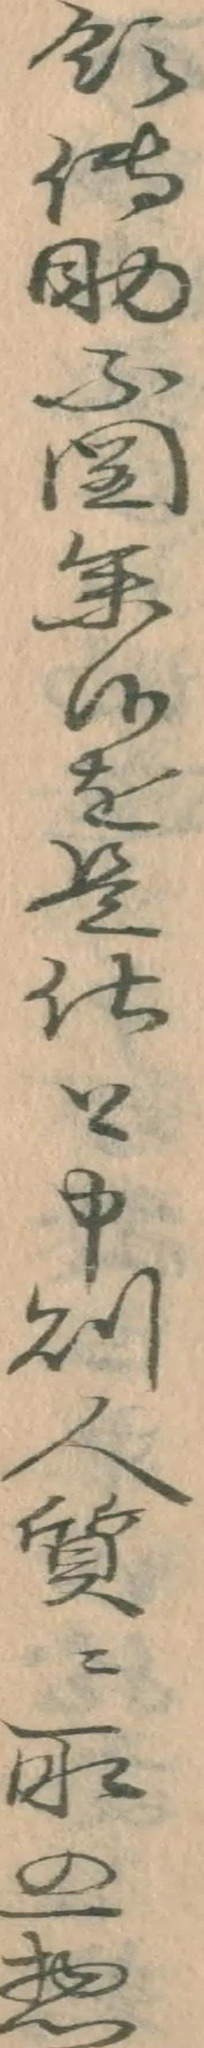領伝助不図参候を是仕と申則人質に取込惣
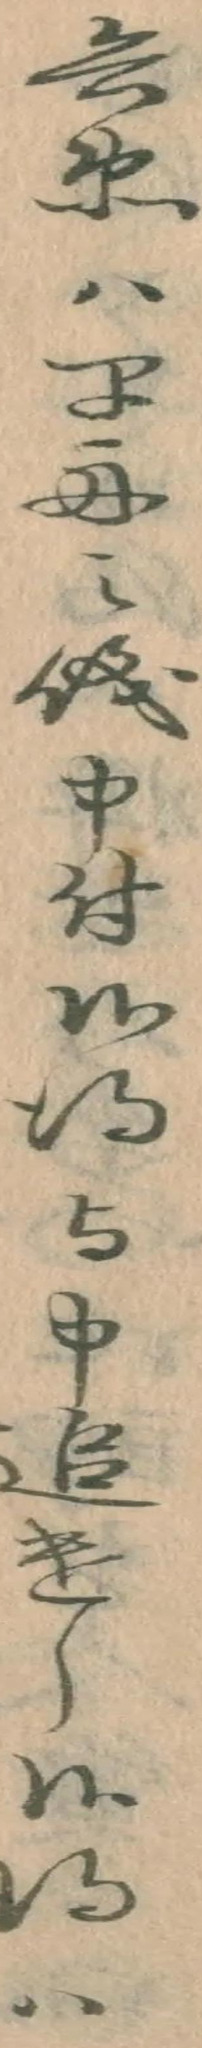兵衛は早舟之儀申付候得与申追遣し候得は
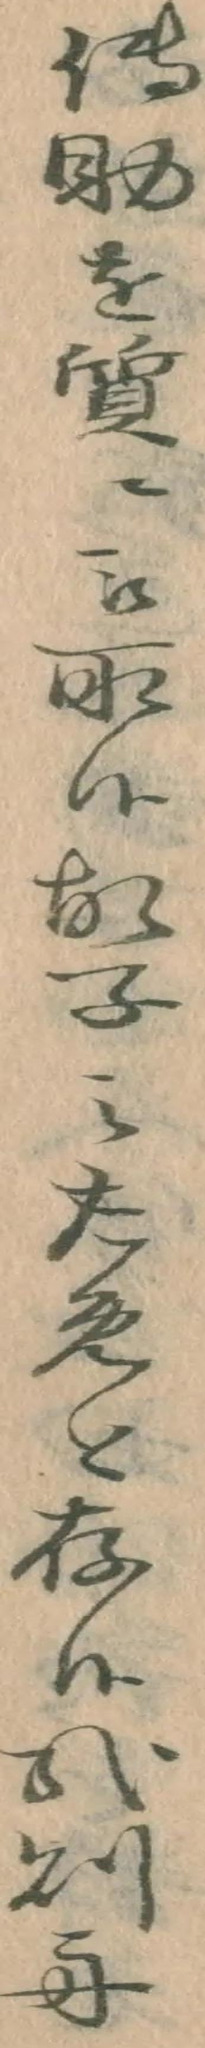伝助を質に被取候故子之ためと存候哉則舟
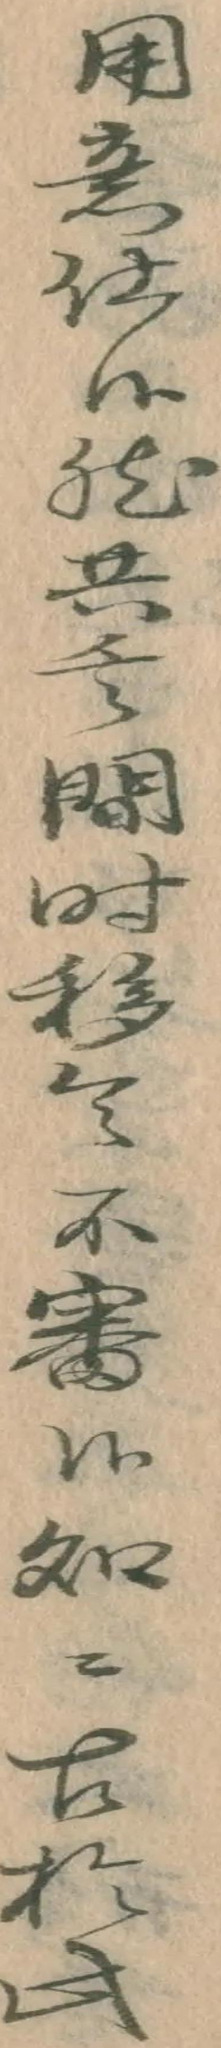用意仕候然共其間時移今不審候処に古於此
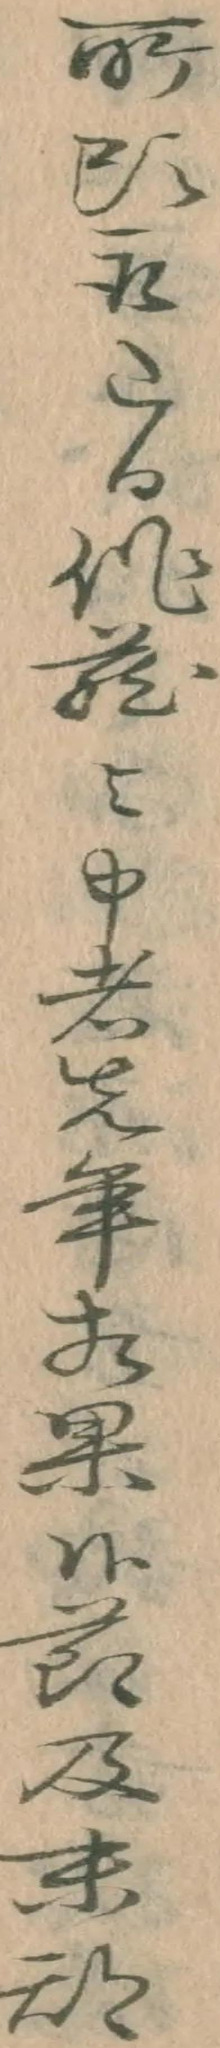所頭取たる作蔵与申者先年相果候節及末期
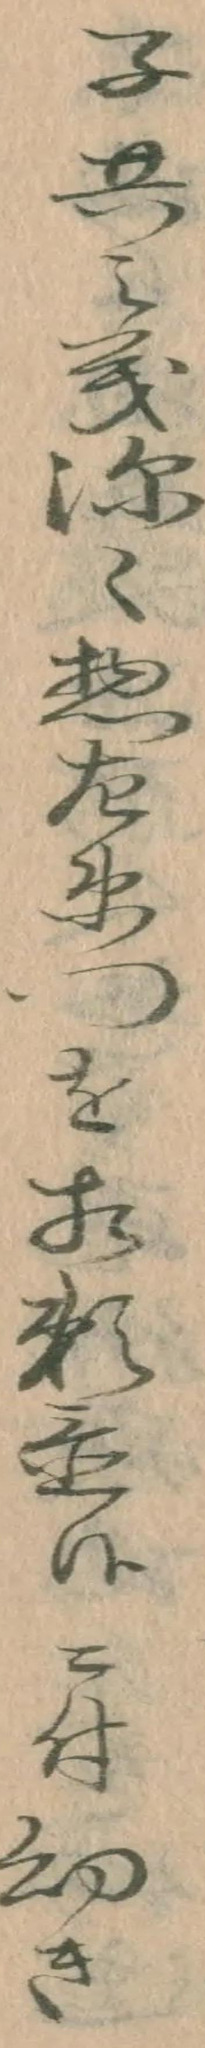子共之義深く惣左衛門を相頼置候に付幼き
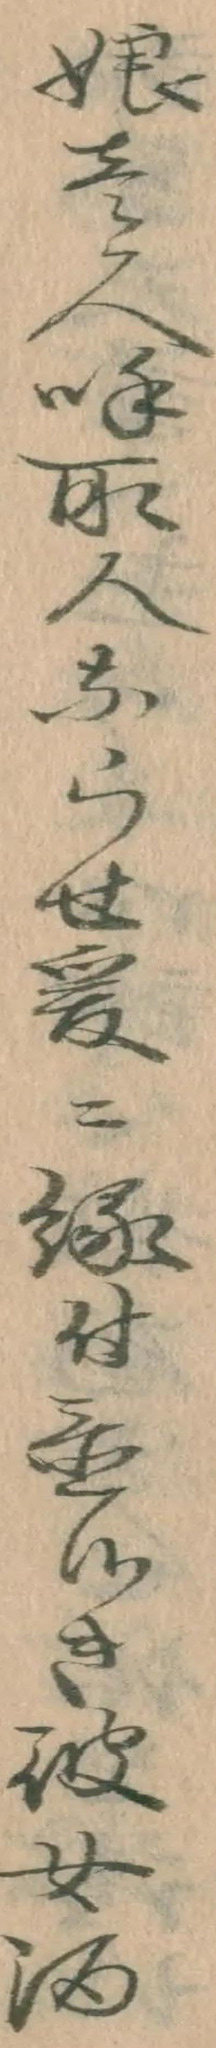娘壱人呼取人ならせ爰に縁付置候き彼女酒
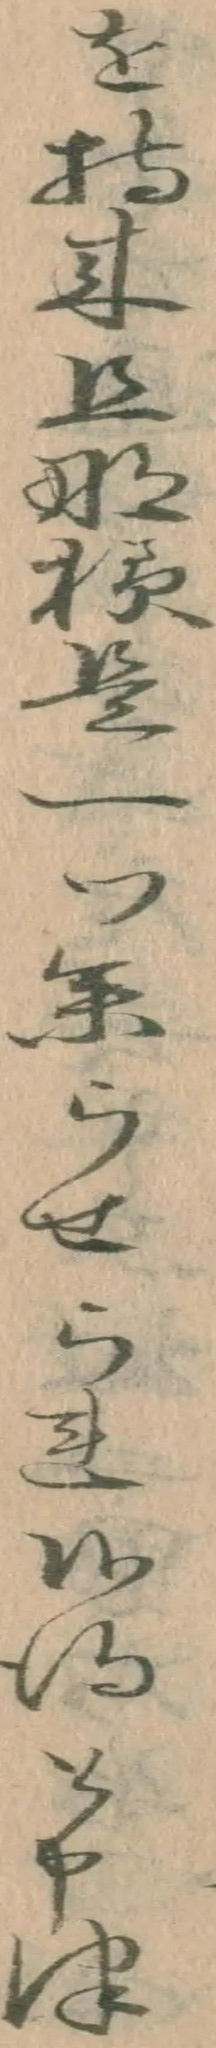を持来旦那様是一つ参らせられ候得と申つ
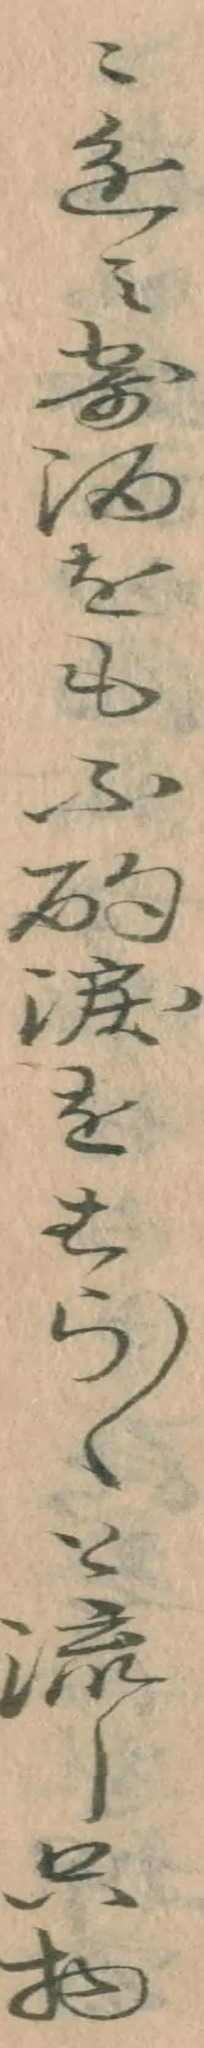に進之奇酒をも不酌涙をはら〱と流し只物
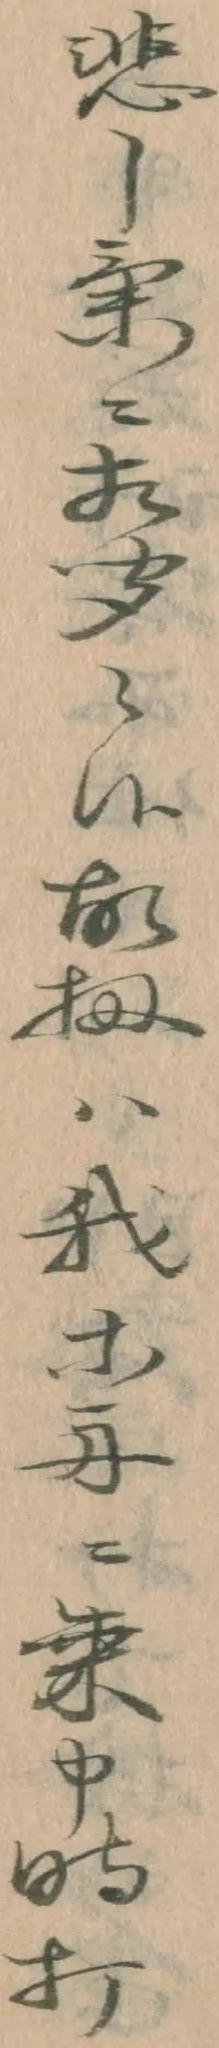悲し気に相聞に候故扨は我等舟に乗申時打
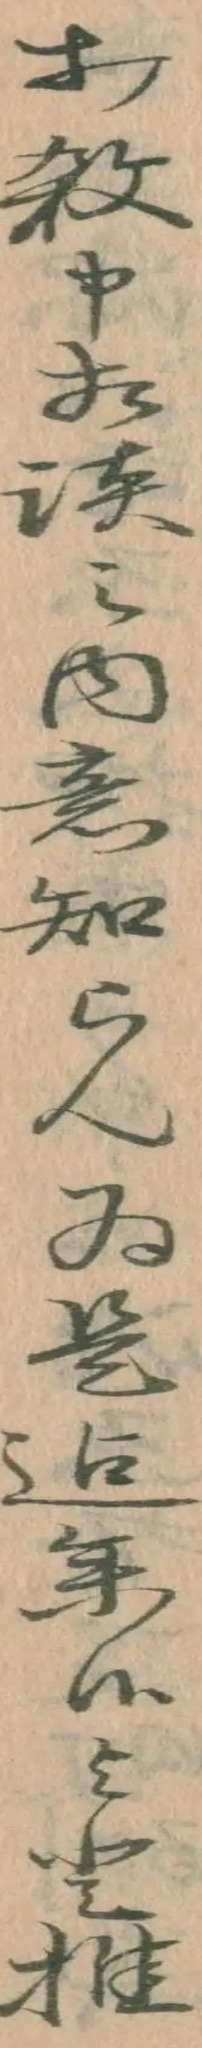打殺申相談之内意知らん為是迄参候よと推
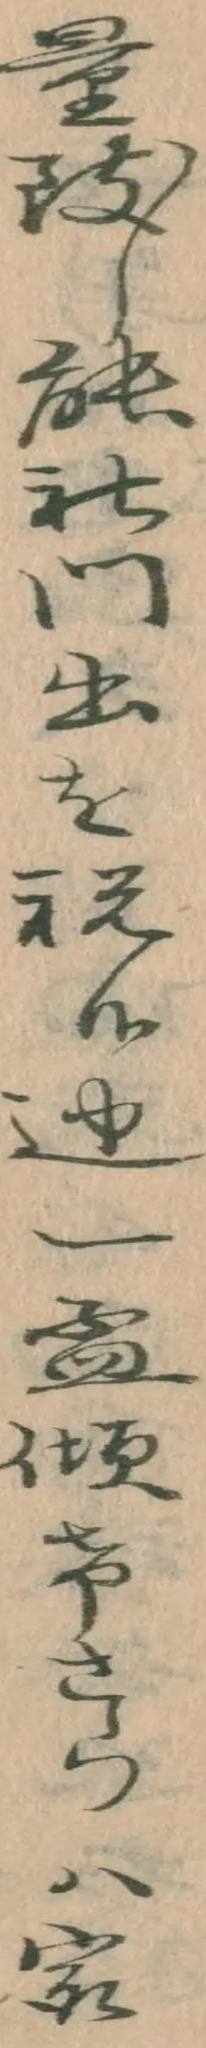量致し能社門出を祝候迚一盃傾けさらは最
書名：切支丹御退治記 49巻. [1]
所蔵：国立国会図書館 National Diet Library, JAPAN
